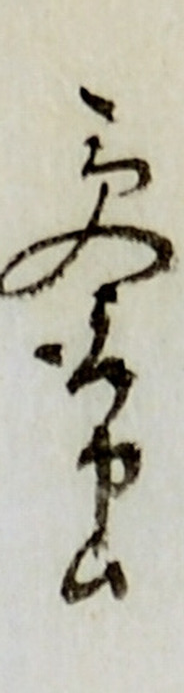受取申候
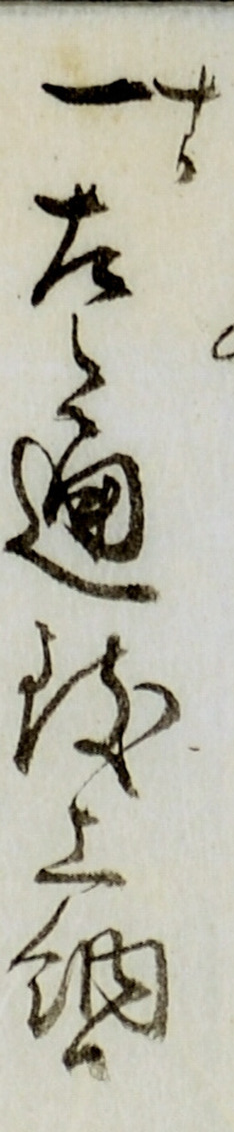一左之通致上納候
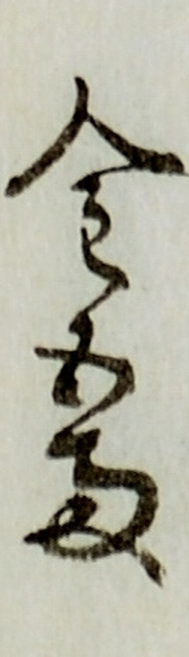金五両
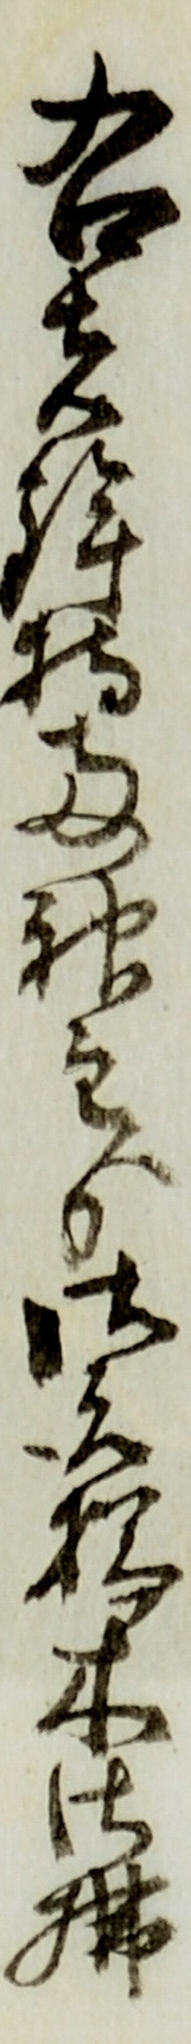右は鉾持両神主ゟ御取揚木御払
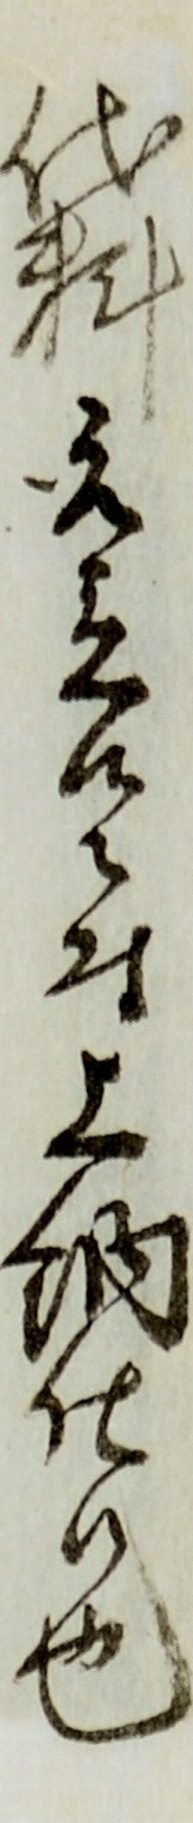代料取立候に付上納仕候也
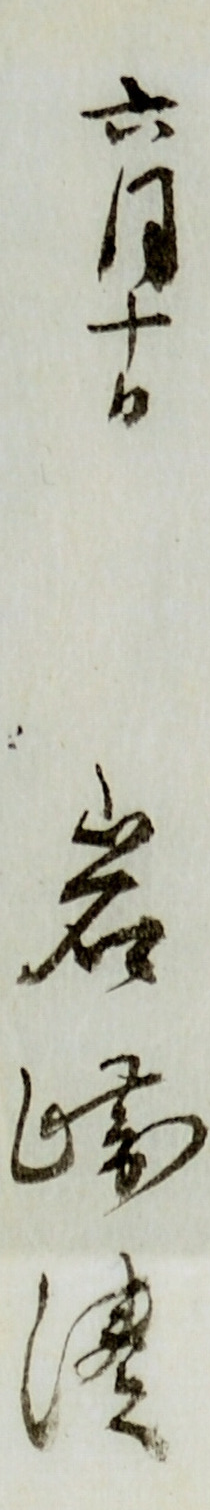六月十日岩崎湊
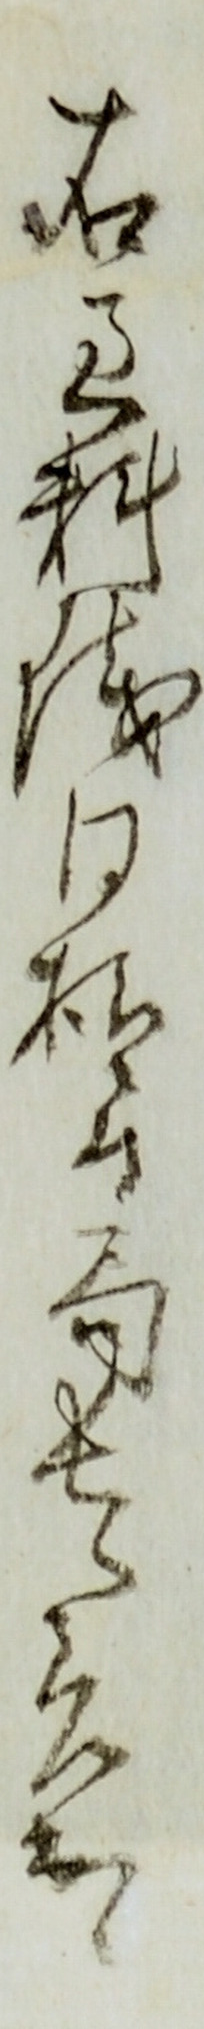右過料銭同様に付局長へ差出候
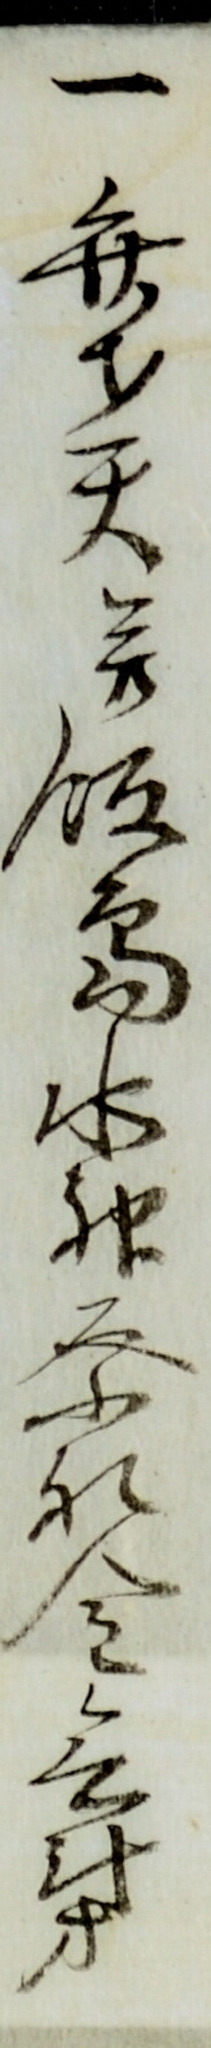一弁才天幷飯島水神祭礼金会計方

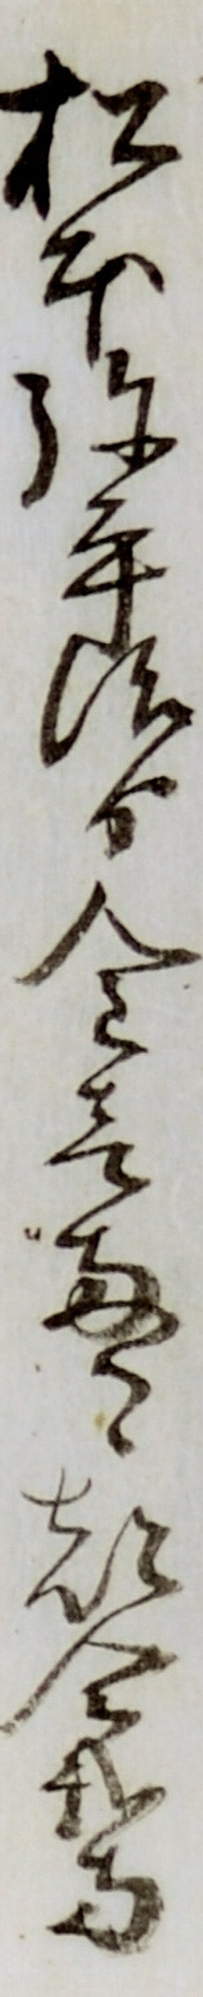松本弥平治ゟ金壱両ツヽ都合弐両
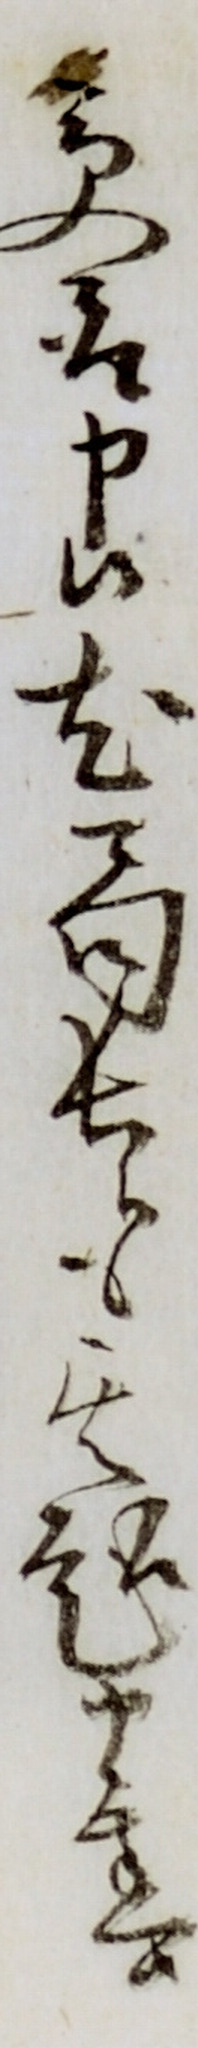受取申候尤局長えも其趣申達候
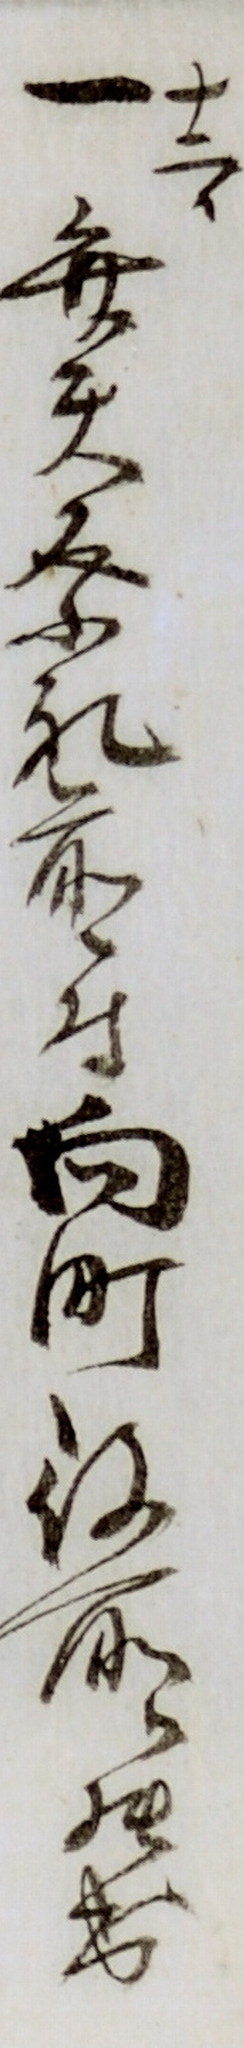一弁天祭礼前に付向町役所え罷出
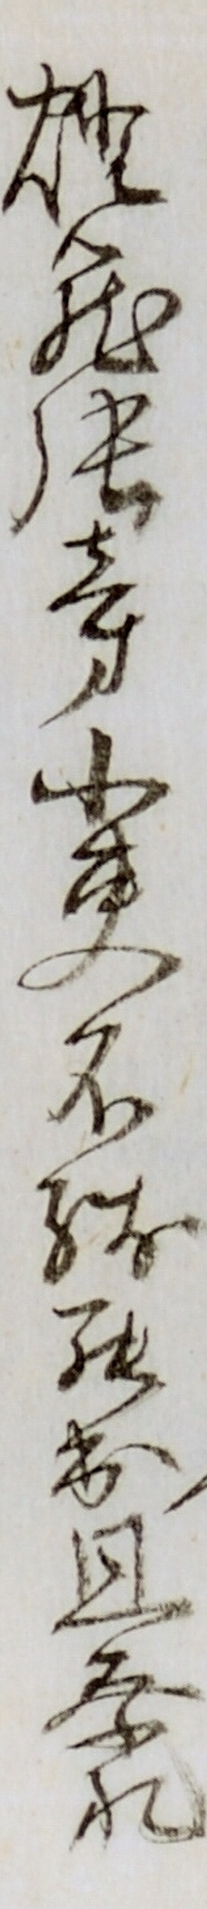灯籠張旁小吏不残罷出且祭礼
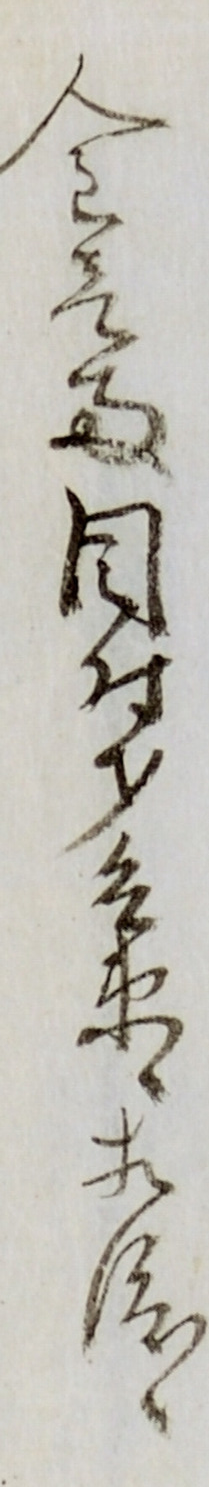金壱両目付才兵衛へ相渡候
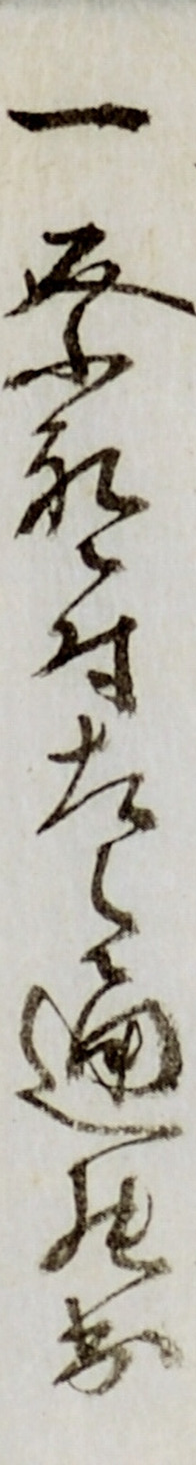一祭礼に付左之通罷出
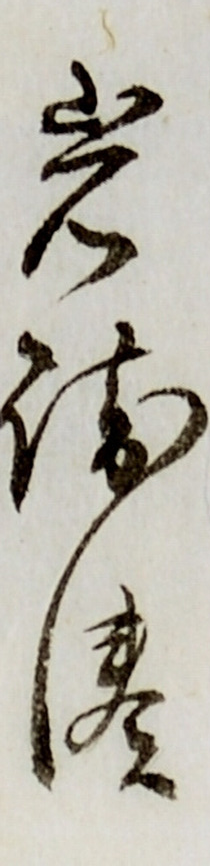岩崎湊
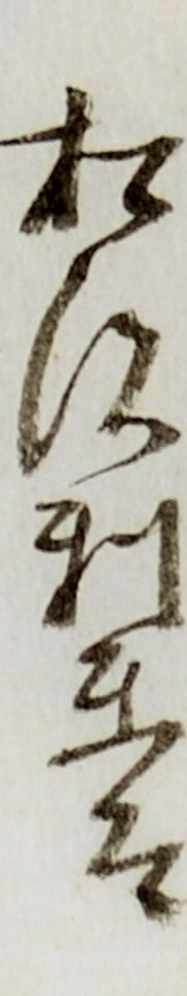松沢利東太
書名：山林方諸事御用留
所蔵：伊那市立高遠町図書館・合同会社AMANE
